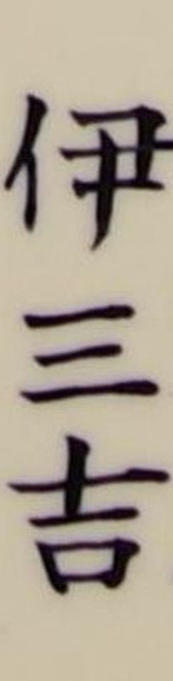伊三吉
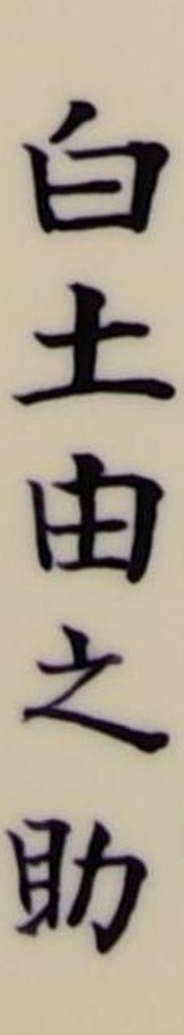白土由之助
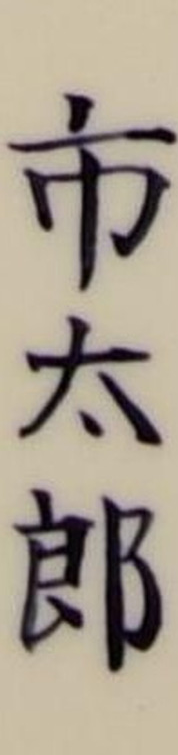市太郎
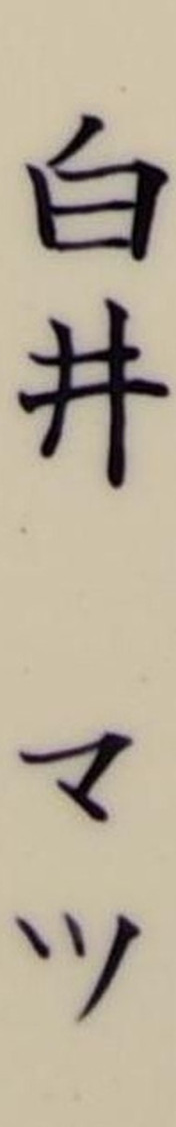白井マツ
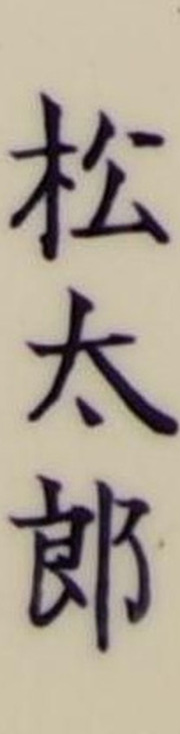松太郎
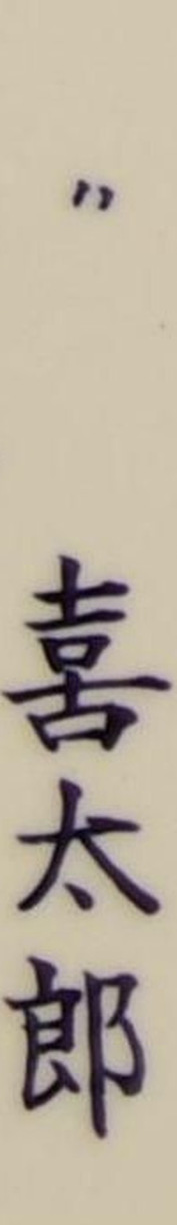喜太郎
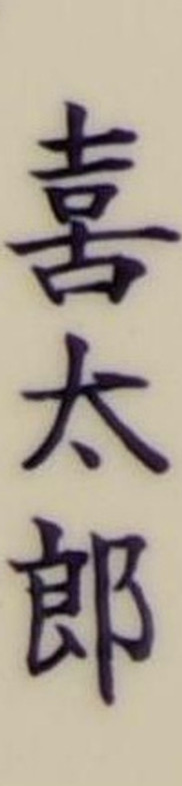喜太郎
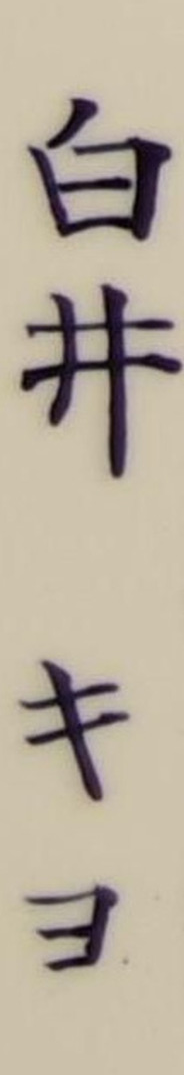白井キヨ
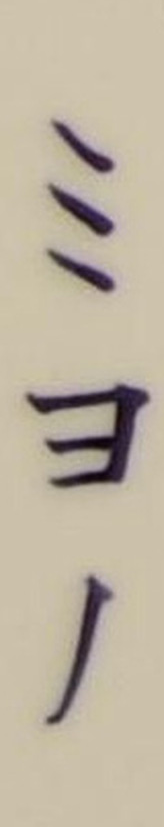ミヨノ

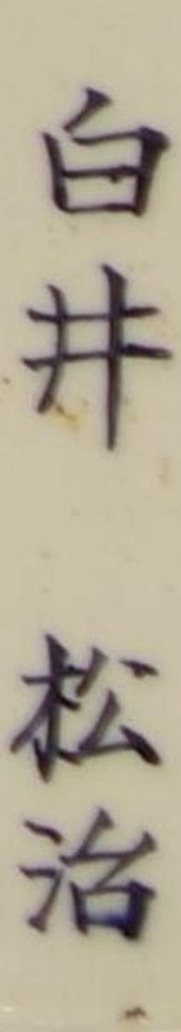白井松治
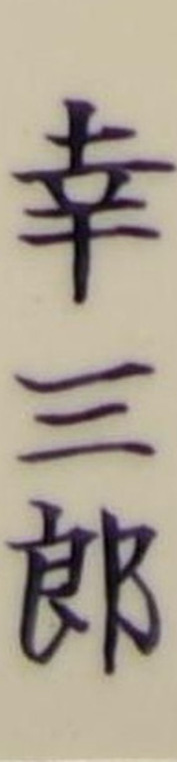幸三郎
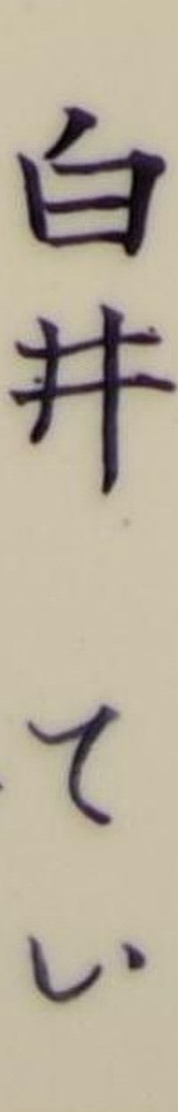白井てい
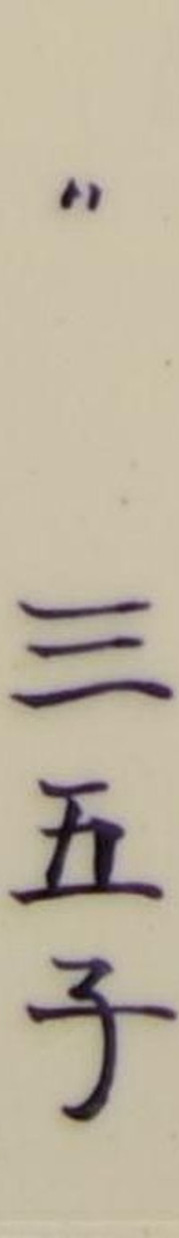三五子
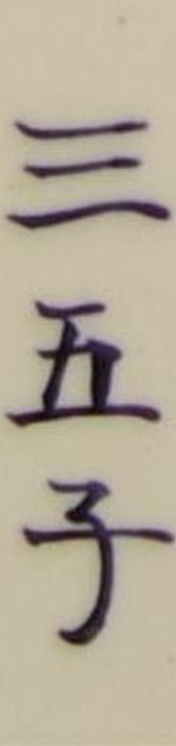三五子
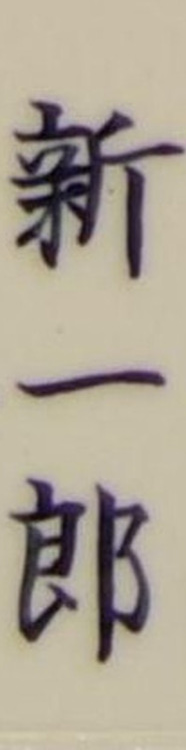新一郎

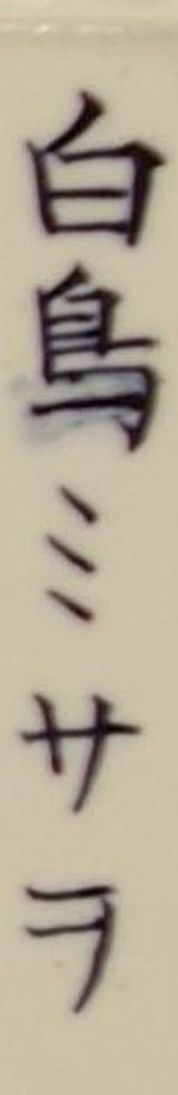白鳥ミサヲ
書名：A~D
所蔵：koyasan kongobuji
